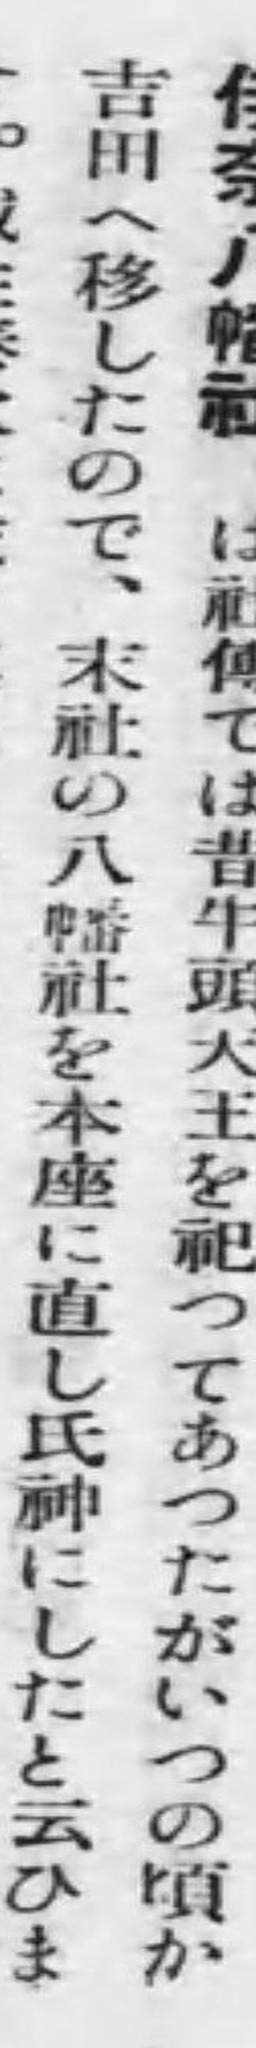吉田へ移したので、末社の八幡社を本座に直し氏神にしたと云ひま
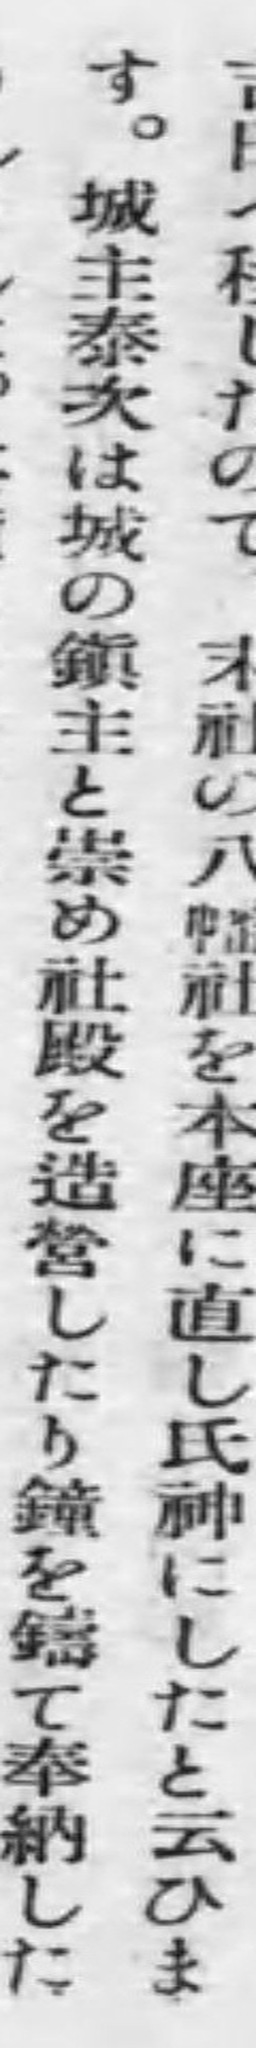す。城主泰次は城の鎮主と崇め社殿を造営したり鐘を鋳て奉納した
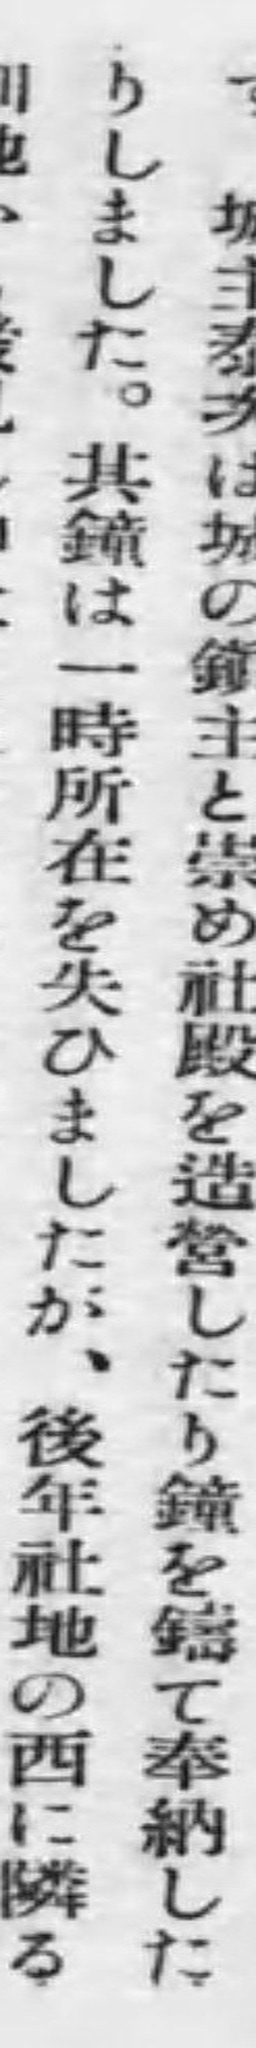りしました。其鐘は一時所在を失ひましたが、後年社地の西に隣る
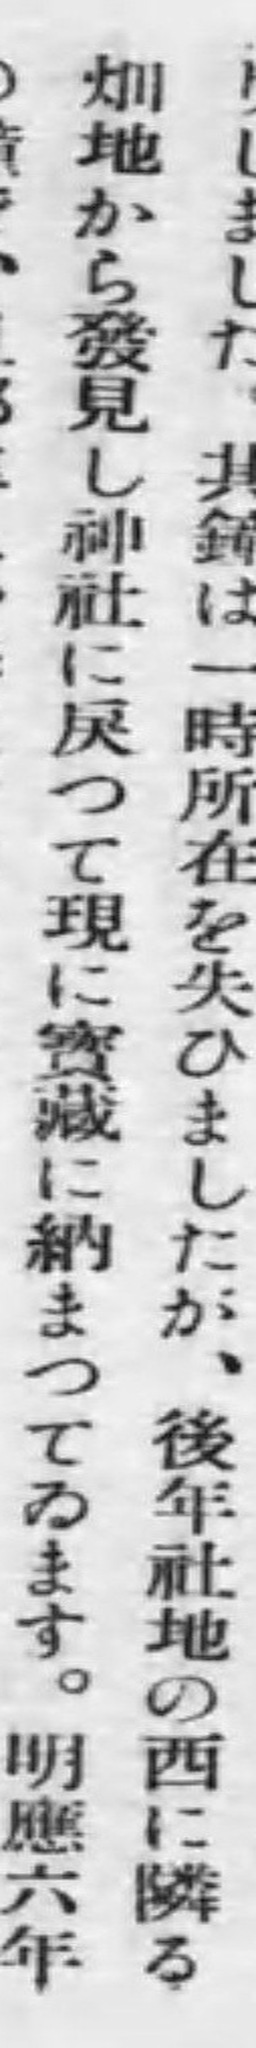畑地から発見し神社に戻つて現に宝蔵に納まつてゐます。明応六年
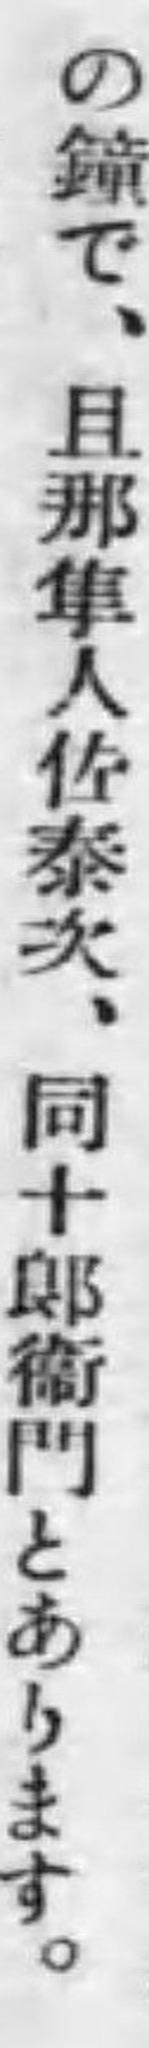の鐘で、且那隼人佐泰次、同十郎衛門とあります。
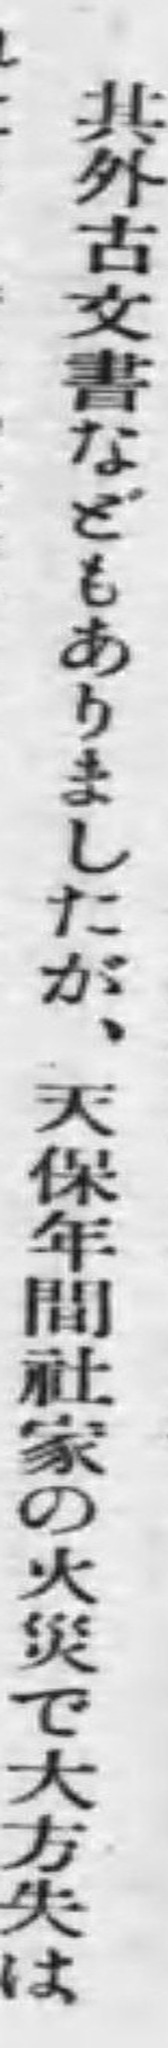其外古文書などもありましたが、天保年間社家の火災で大方失は
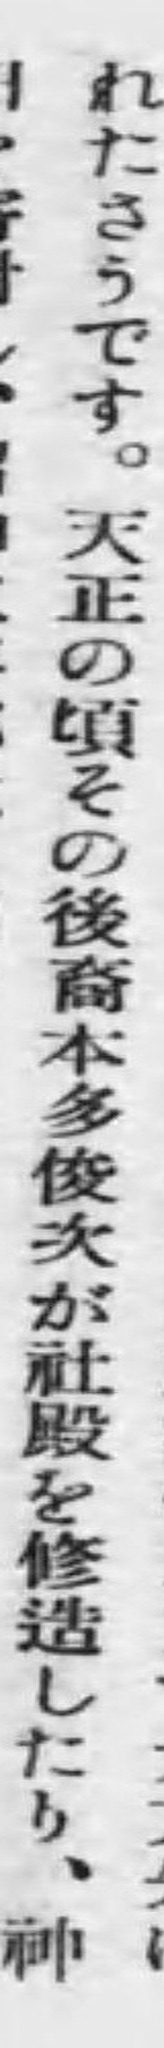れたさうです。天正の頃その後裔本多俊次が社殿を修造したり、神
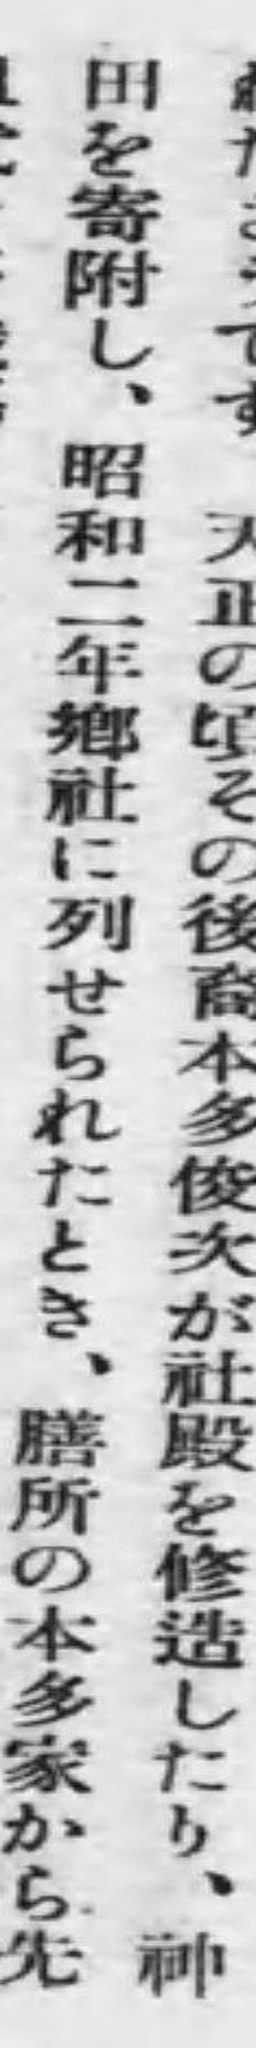田を寄附し、昭和二年郷社に列せられたとき、膳所の本多家から先
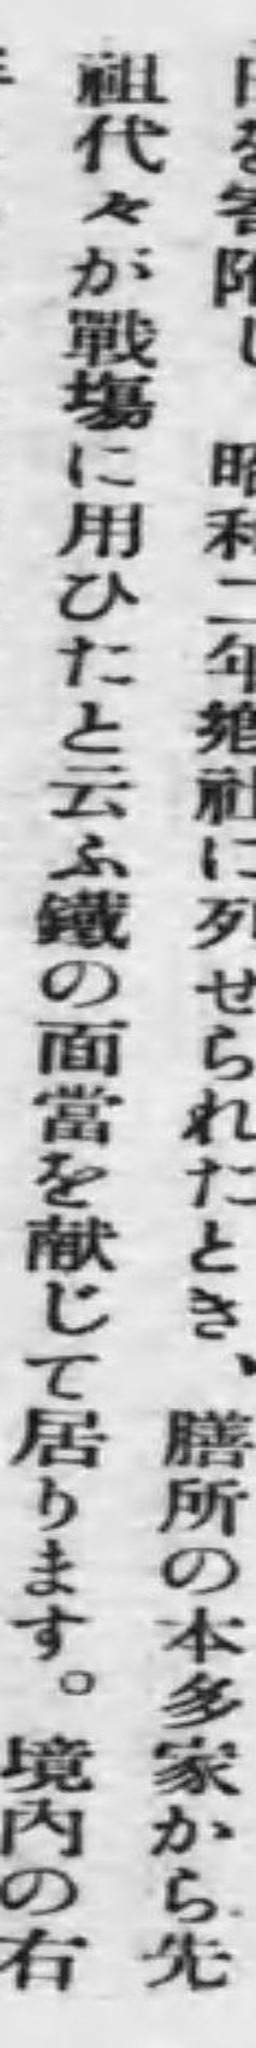祖代々が戦場に用ひたと云ふ鉄の面当を献じて居ります。境内の右
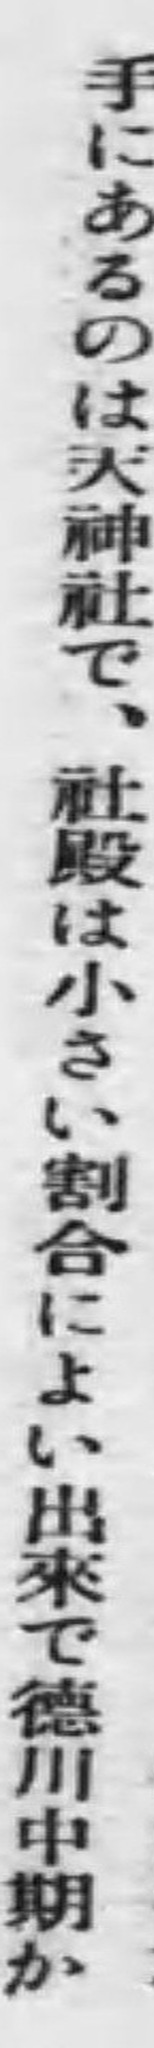手にあるのは天神社で、社殿は小さい割合によい出来で徳川中期か
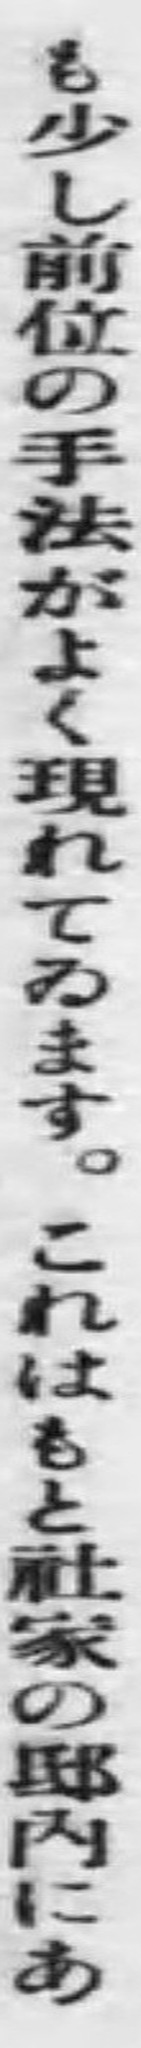も少し前位の手法がよく現れてゐます。これはもと社家の邸内にあ
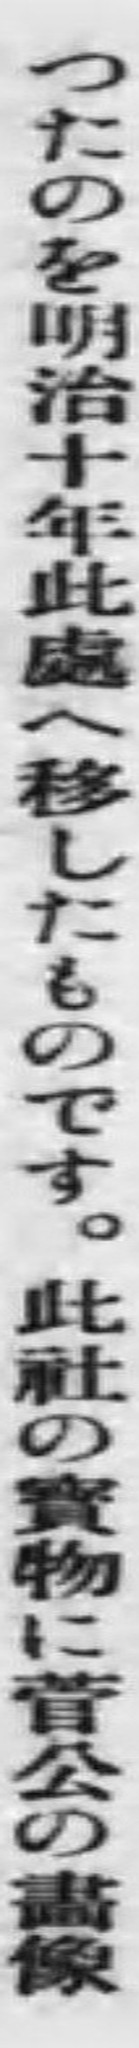つたのを明治十年此処へ移したものです。此社の宝物に菅公の画像
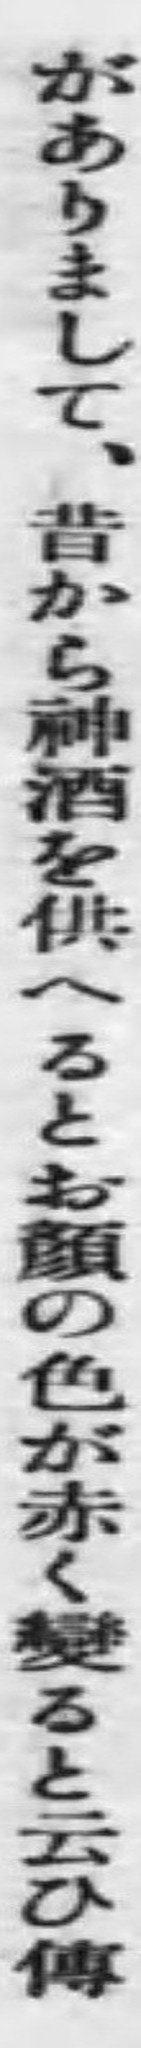がありまして、昔から神酒を供へるとお顔の色が赤く変ると云ひ伝
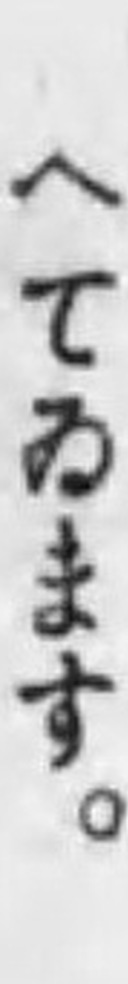へてゐます。
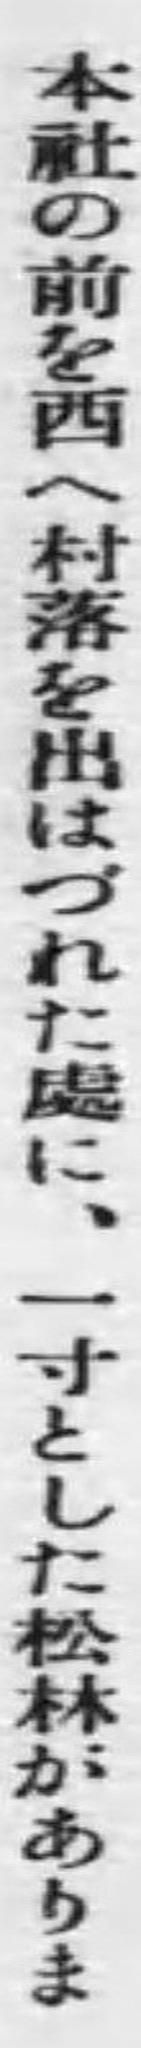本社の前を西へ村落を出はづれた処に、一寸とした松林がありま
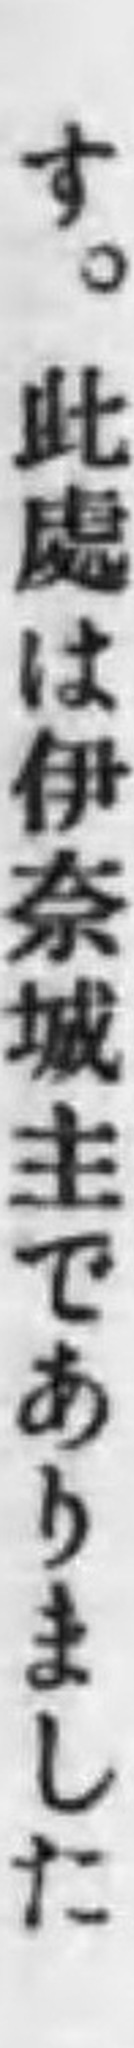す。此処は伊奈城主でありました
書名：東三河道中記 : 豊橋市及其附近案内
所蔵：国立国会図書館 National Diet Library, JAPAN
